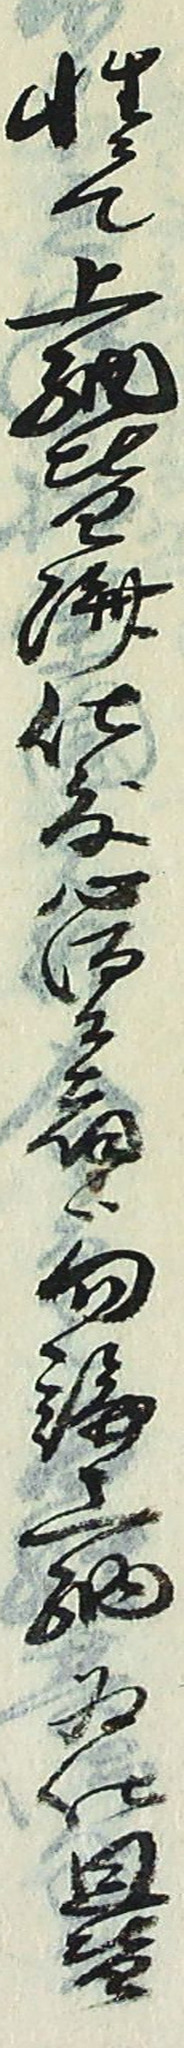性ニて上納皆済仕度心得候者ハ勿論上納為仕且皆
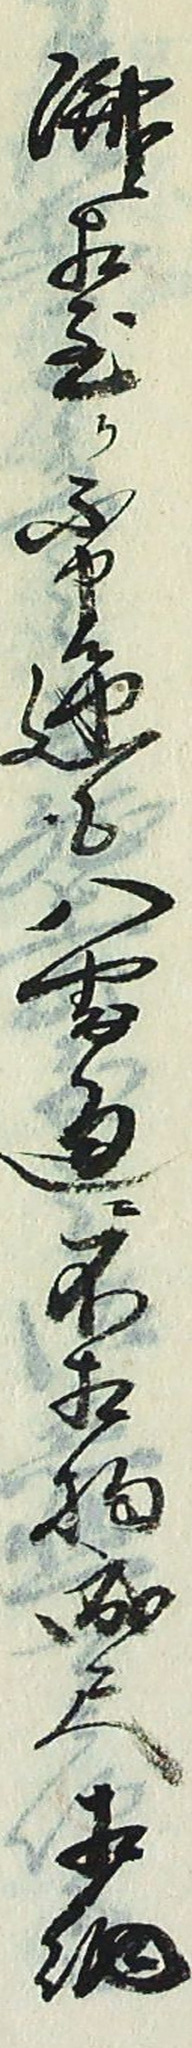済ニ相至り不申候迚も八歩通ニ不相拘成丈相納
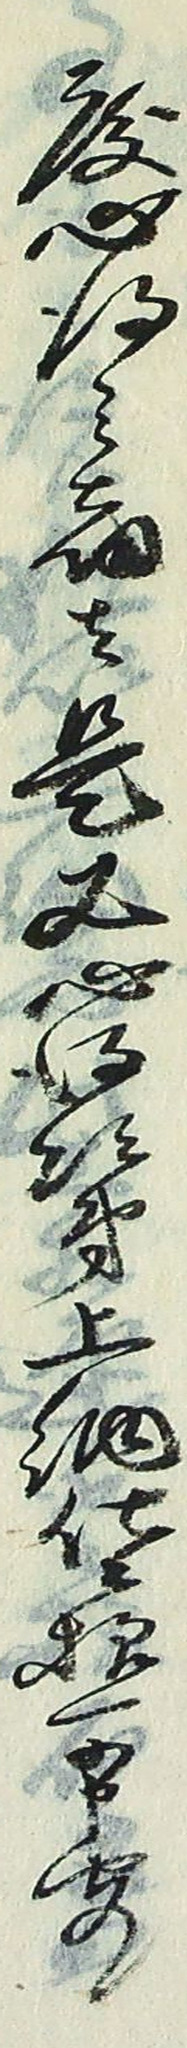度心得之者は是又心得次第上納仕候様可申聞候
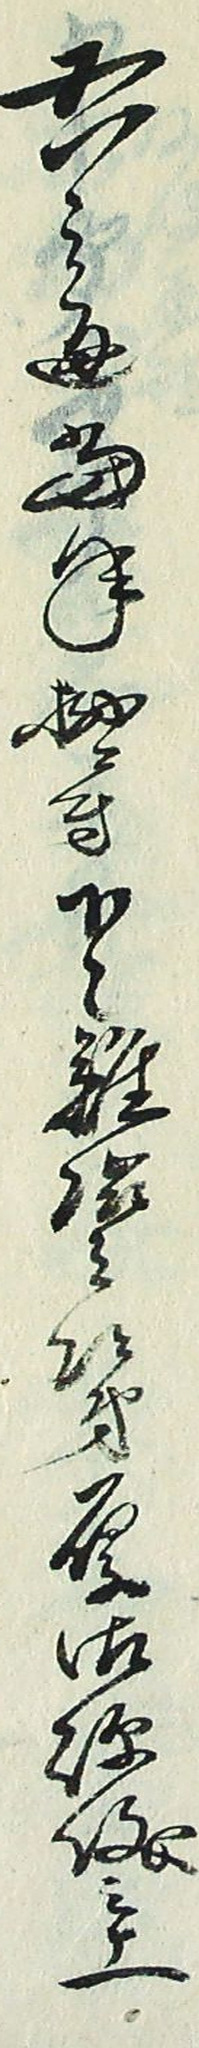右之通當年柄ニ付下々難渋之次第厚御評儀之上
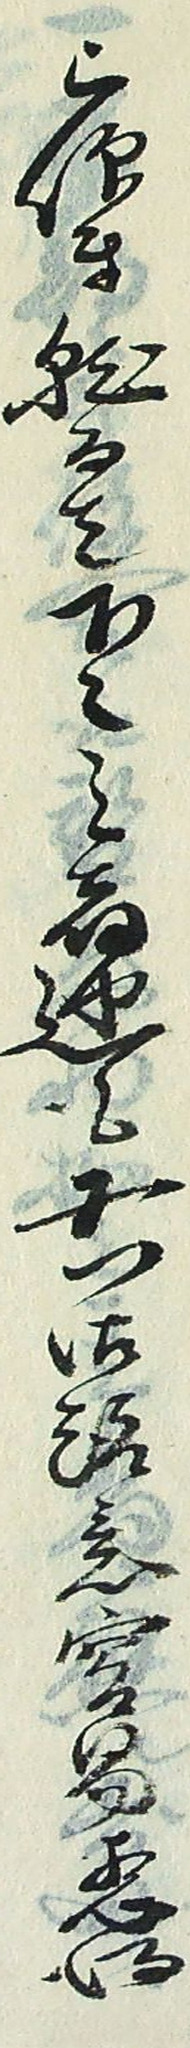被仰付就而者下々之者迚も右御趣意容易相心得
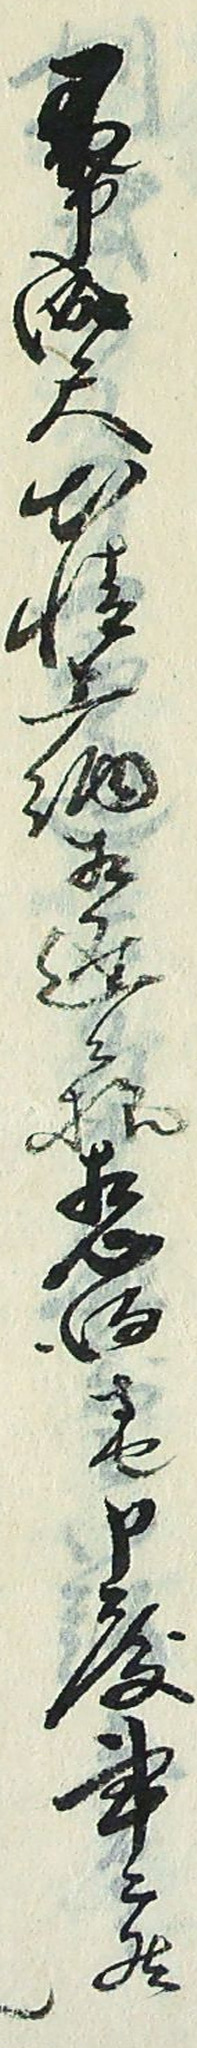不申成丈出精上納相進候様相心得させ申度事ニ候
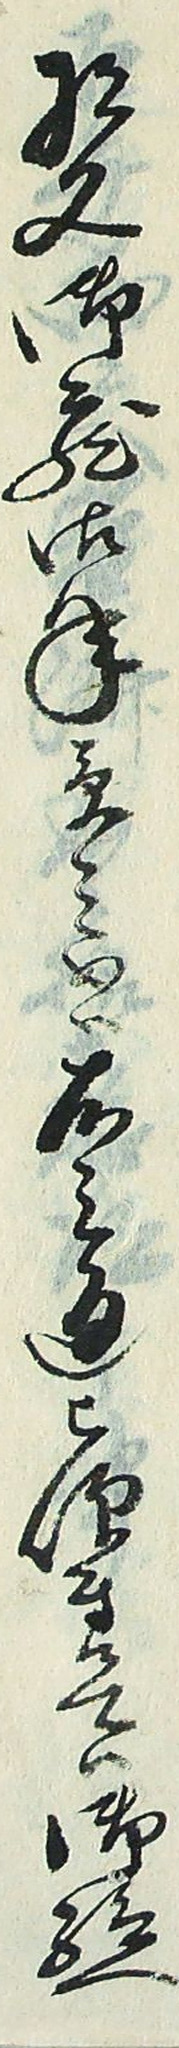猶又御蔵御年貢之義ハ右之通被仰付候てハ御給人

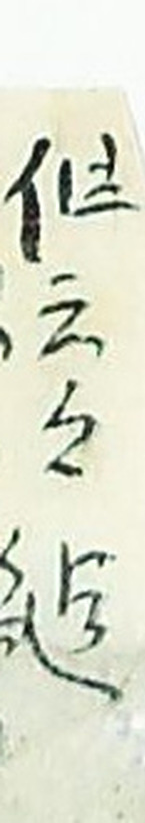但云々迄
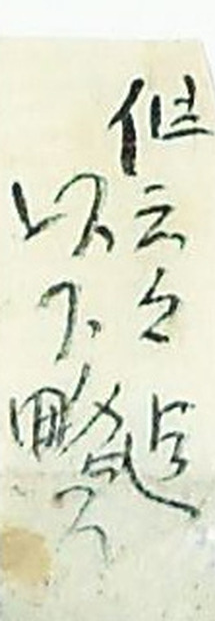以下略ス

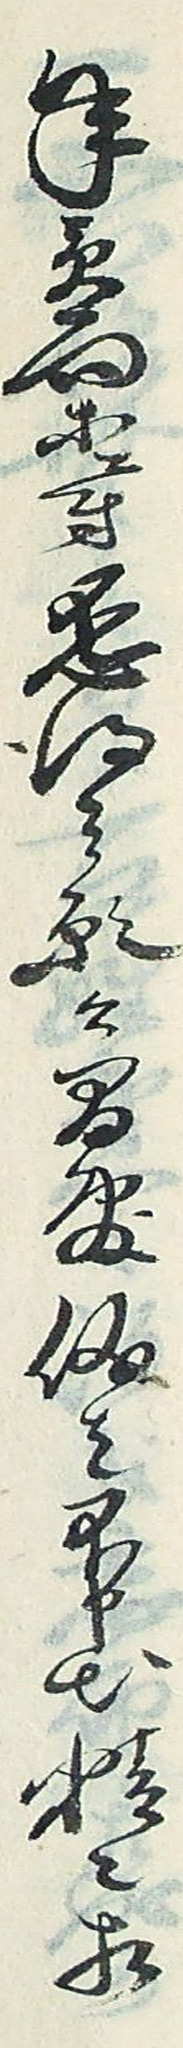年貢向等ニ付不心得之願々間敷儀者不申出精々相
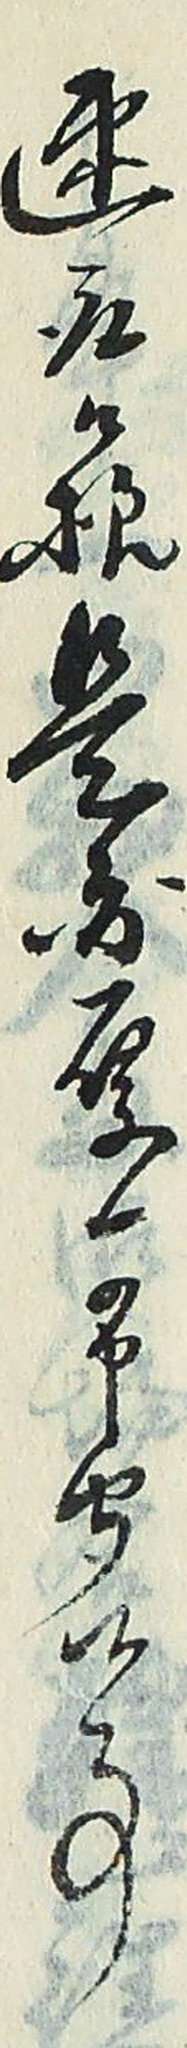速取候様是亦厚可申聞候事
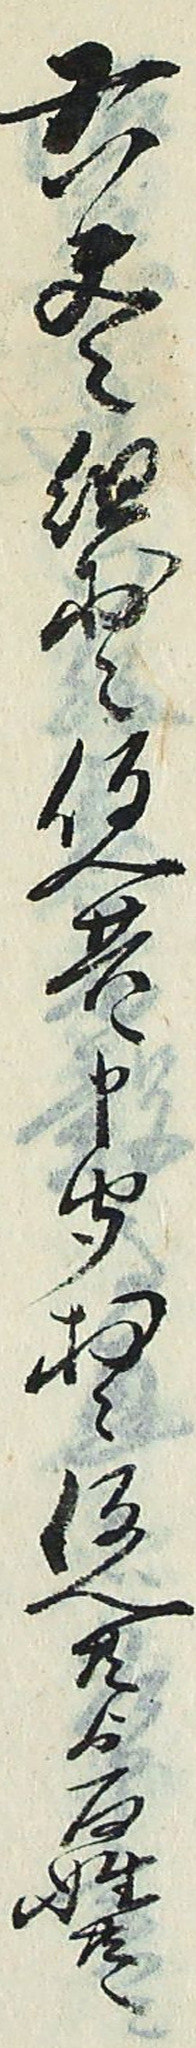右夫々組村々役人共へ申聞村々役人共ゟ百姓共へ
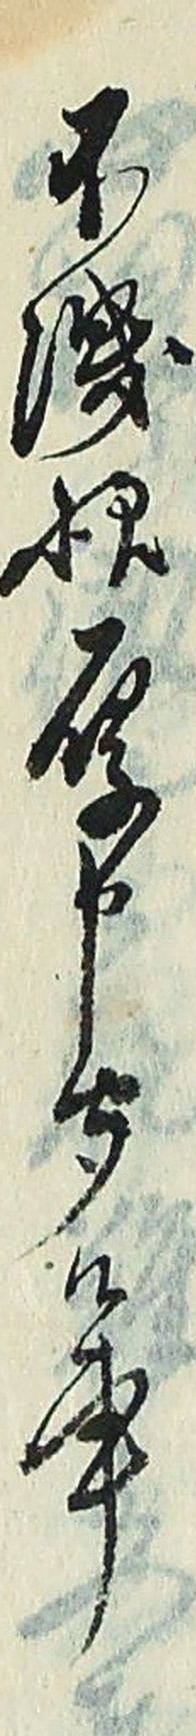不洩様厚申聞候事
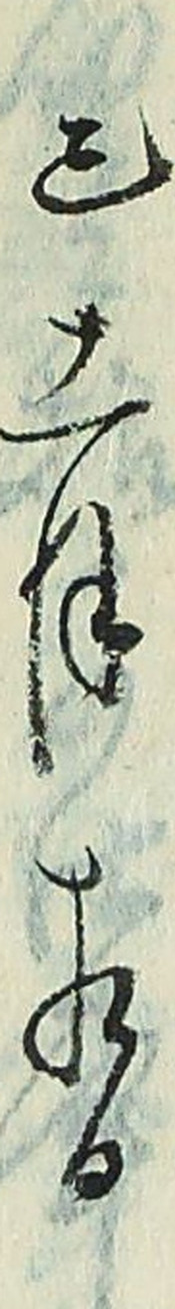巳十一月十九日
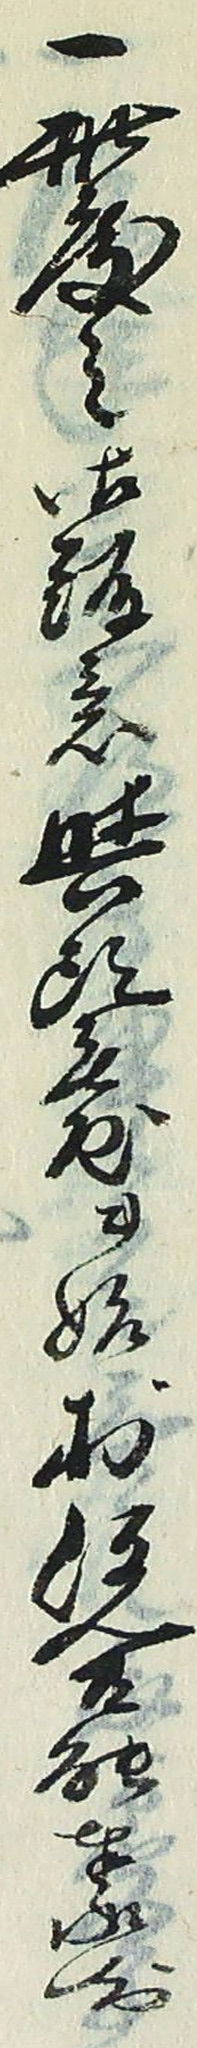一此度之御趣意與頭庄屋ヲ始村役人共能奉承知
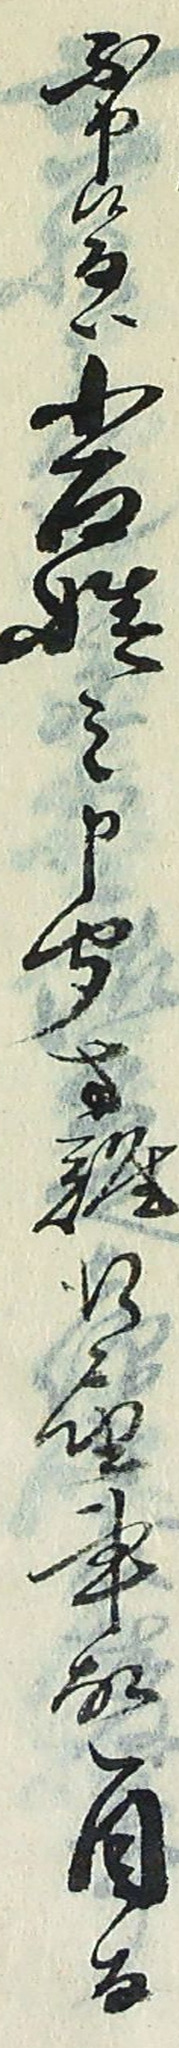不申候而ハ小百姓之申聞方難行届事故自而
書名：諸御趣意書并御下知向之写
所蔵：鳴門教育大学 Naruto University of Education
